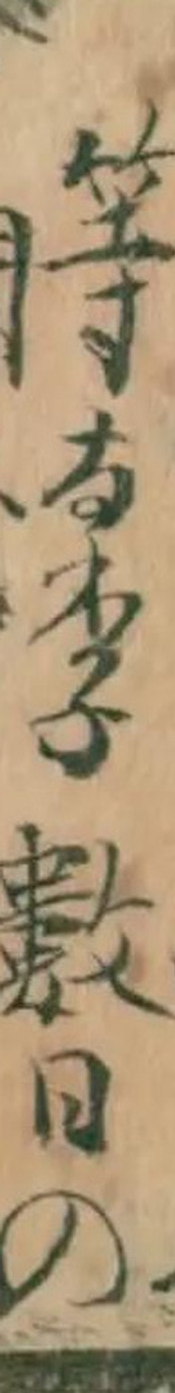等なり数日の
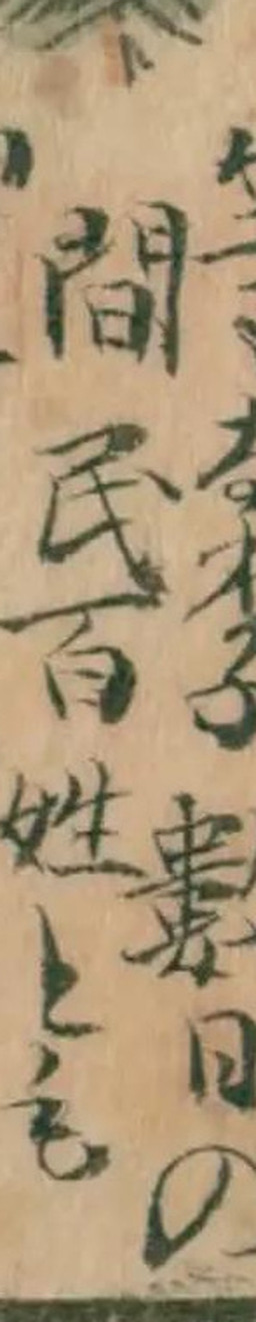間民百姓とも
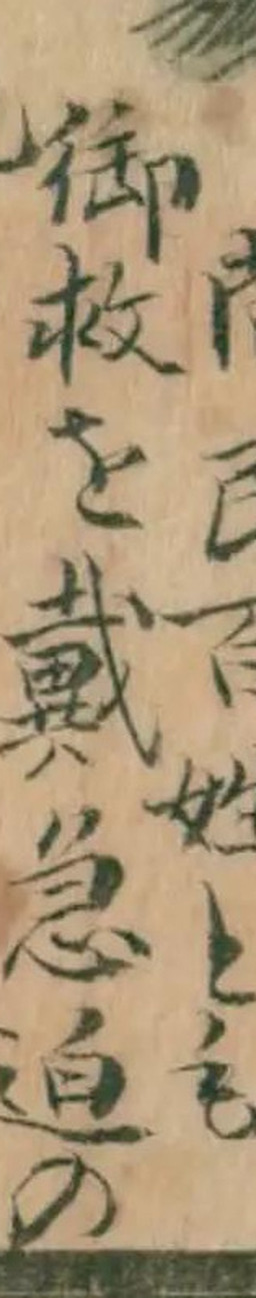御救を戴急迫の
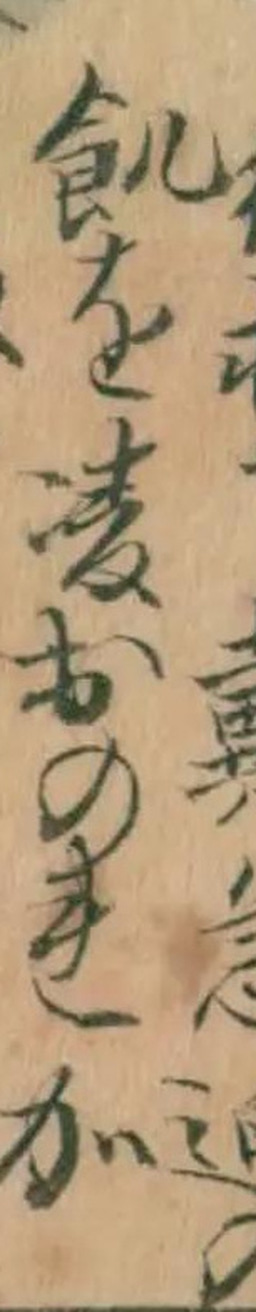飢を凌おのれか
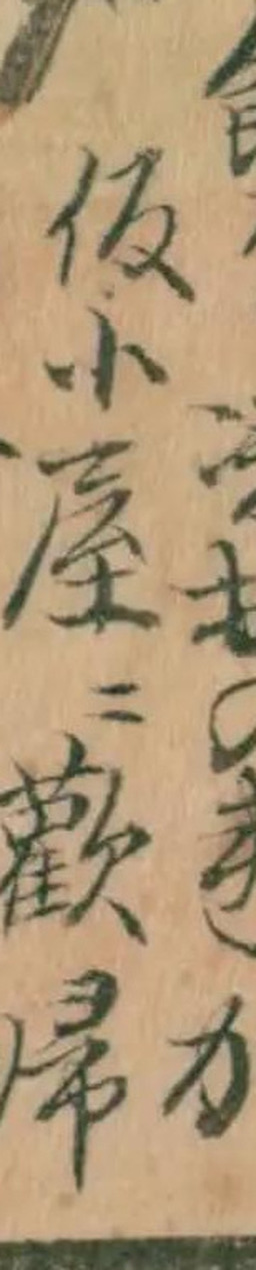仮小屋ニ歓帰
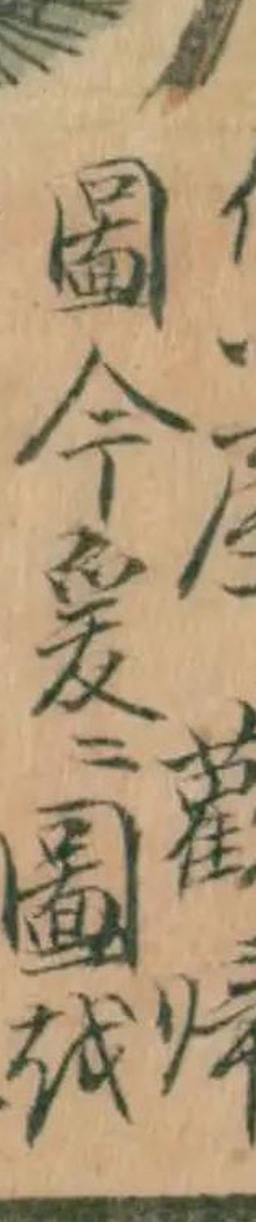図今爰ニ図を
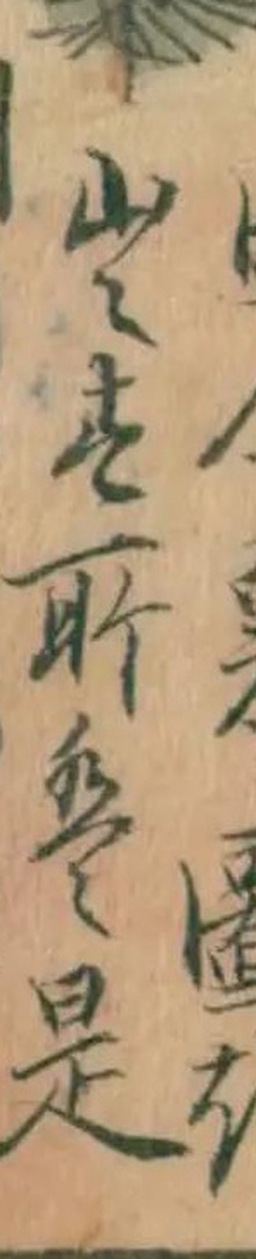出す所は是
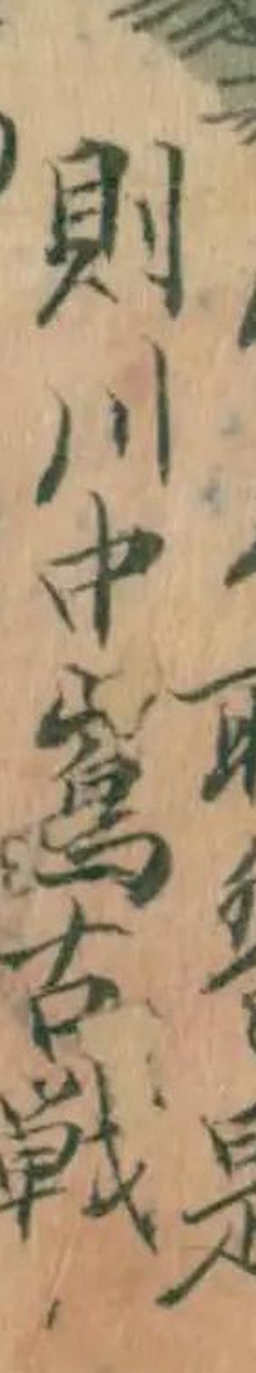則川中嶌古戦
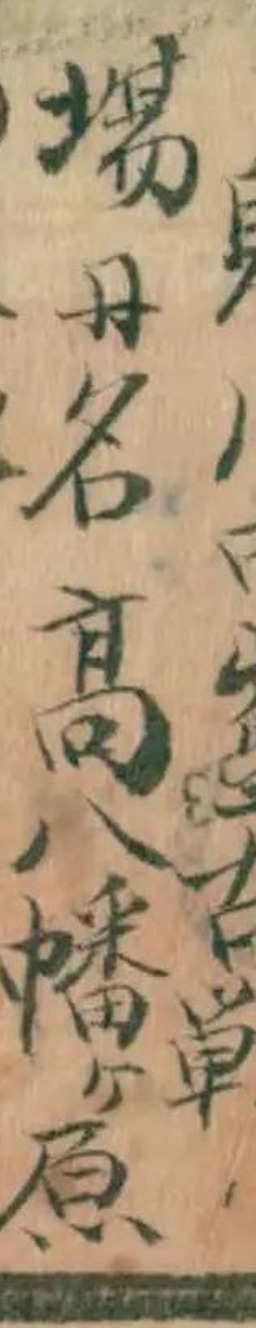場に名高八幡ケ原
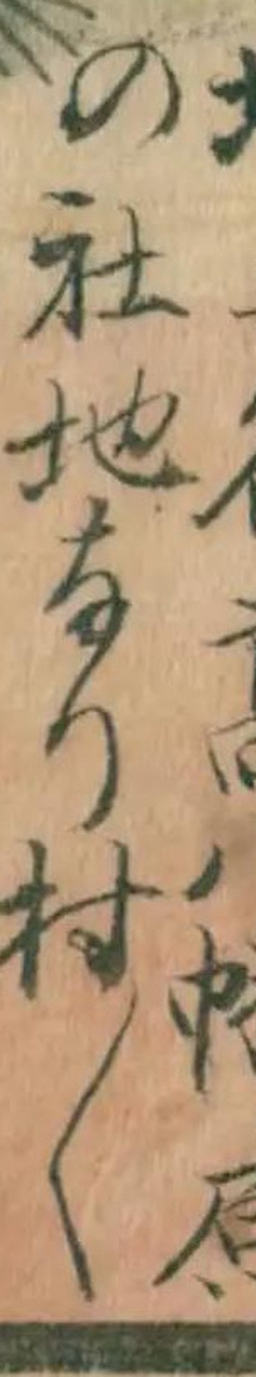の社地なり村〳〵
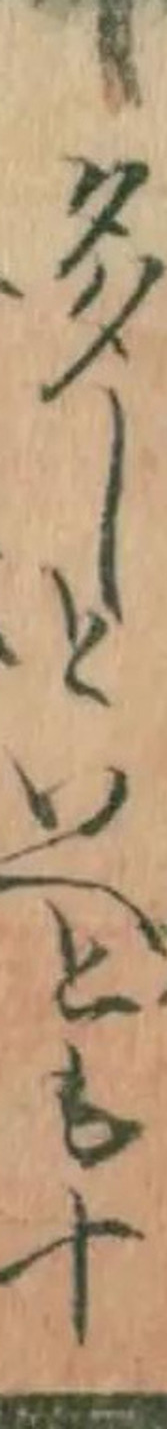多しといへとも十
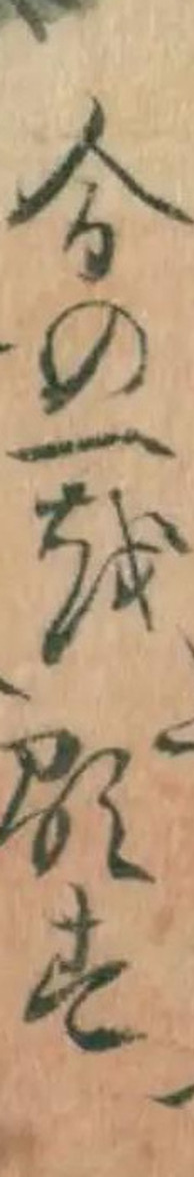分の一を顕す
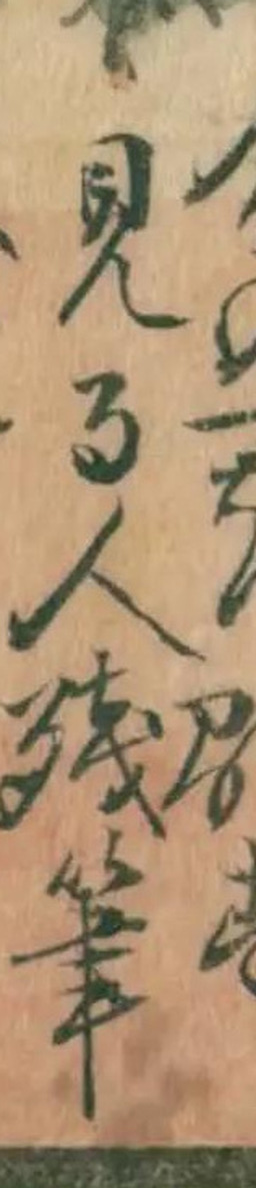見る人残筆
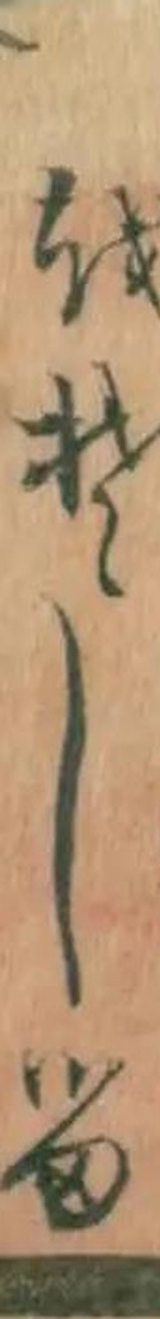をそしる
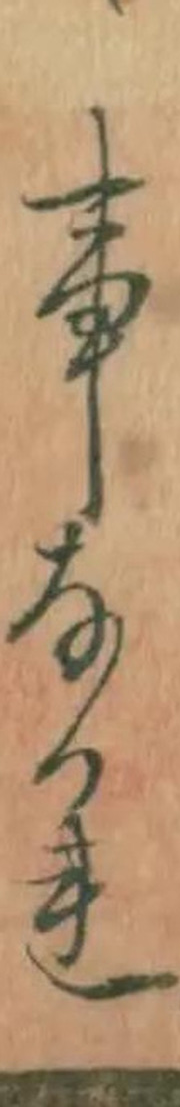事なかれ

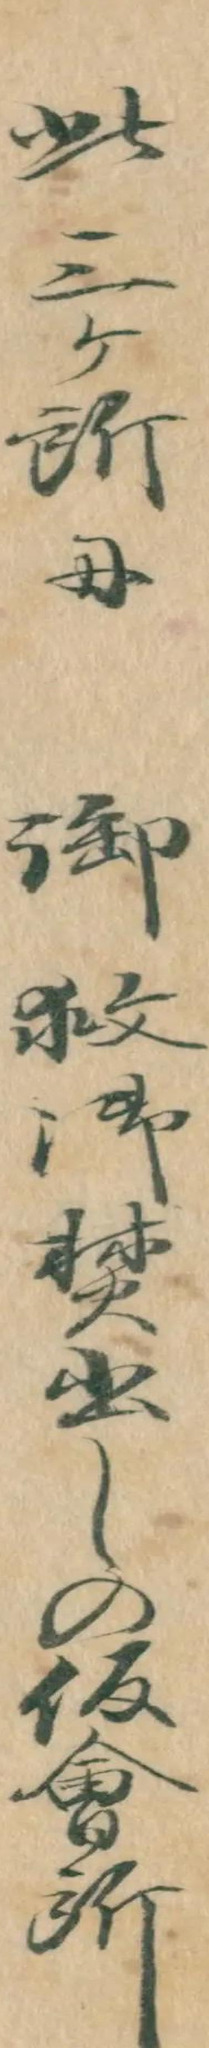此三ヶ所に御救御焚出しの仮会所
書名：俗語之種. [6]
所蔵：国立国会図書館 National Diet Library, JAPAN
